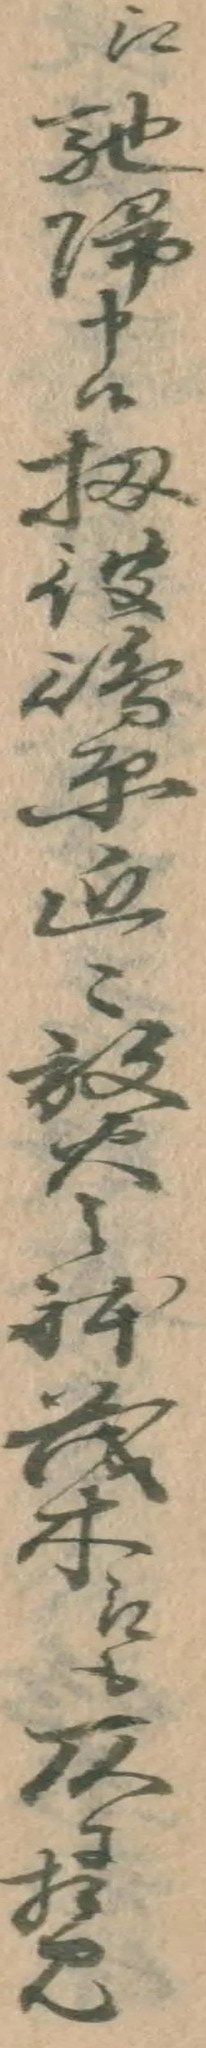え馳帰申候扨彼島原近々放火の体茂木えも仄に相見
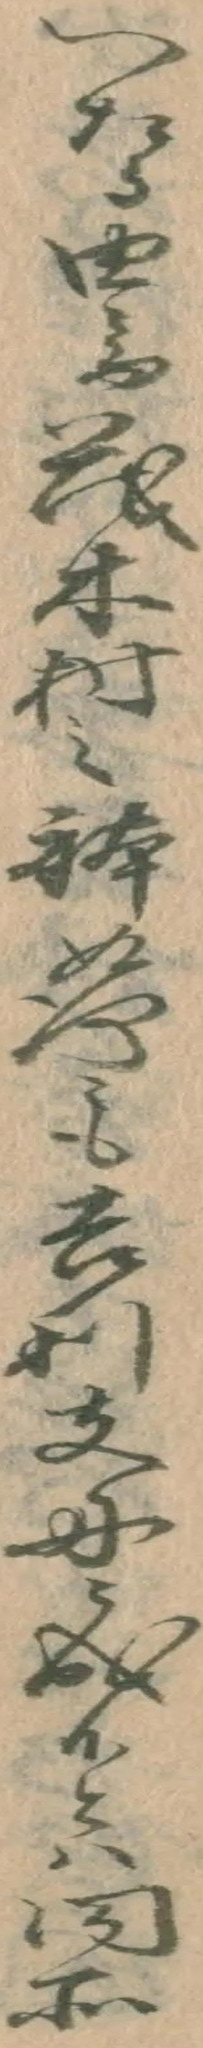へたる由に而茂木村之体如何にも吉利支丹に成候とは聞所
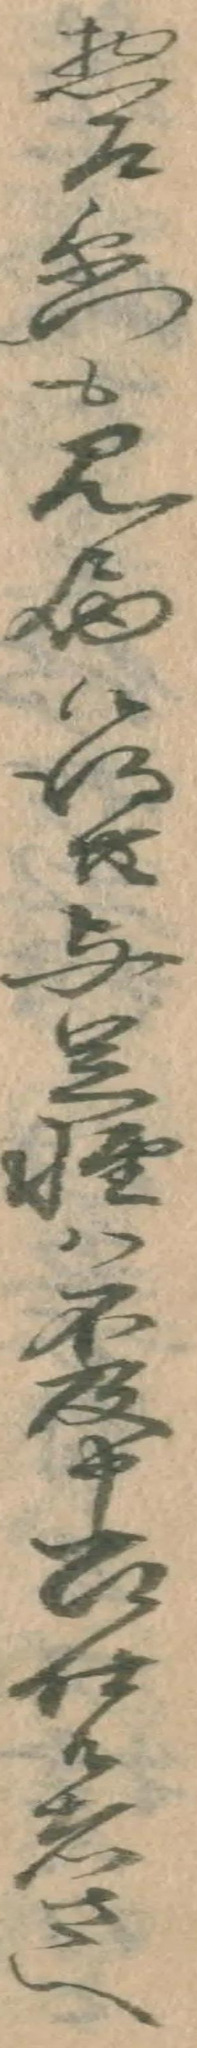惣左衛門も見届候得共与足軽は不及申召仕候者さへ
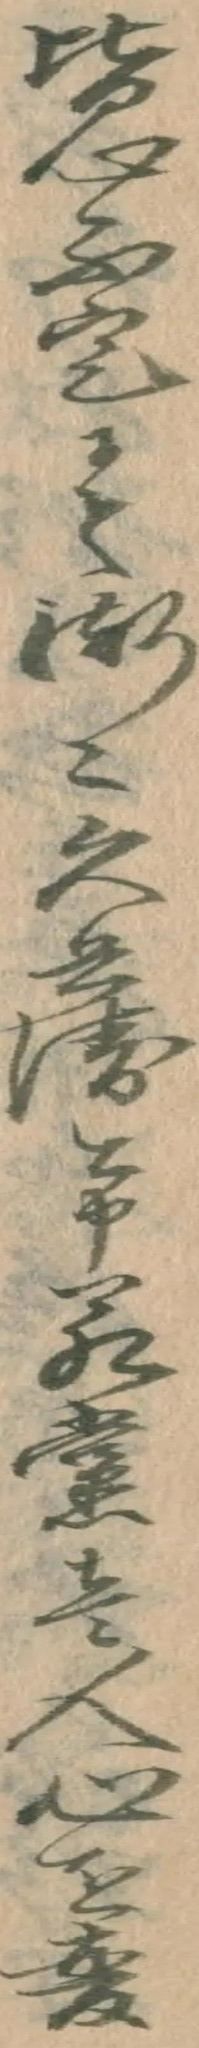皆心不定にて漸々久兵衛と申若党壱人心を変
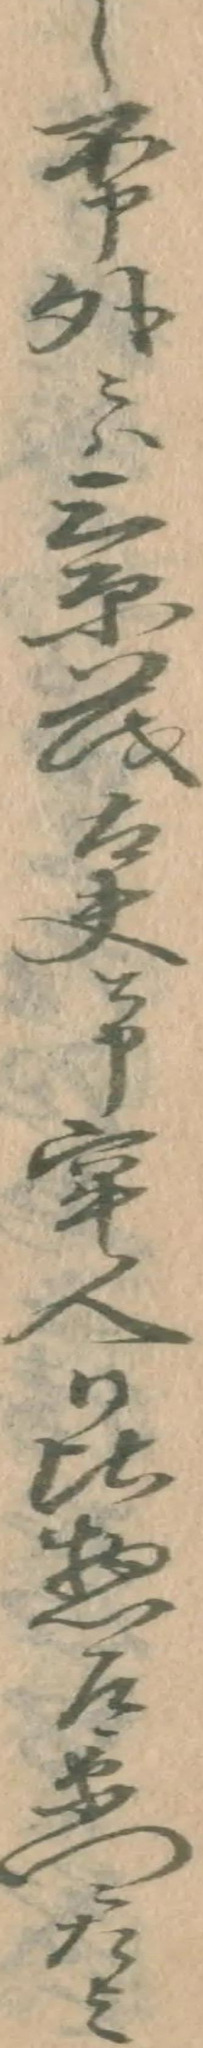し不申外には三原茂太夫と申牢人日比惣左衛門にたよ
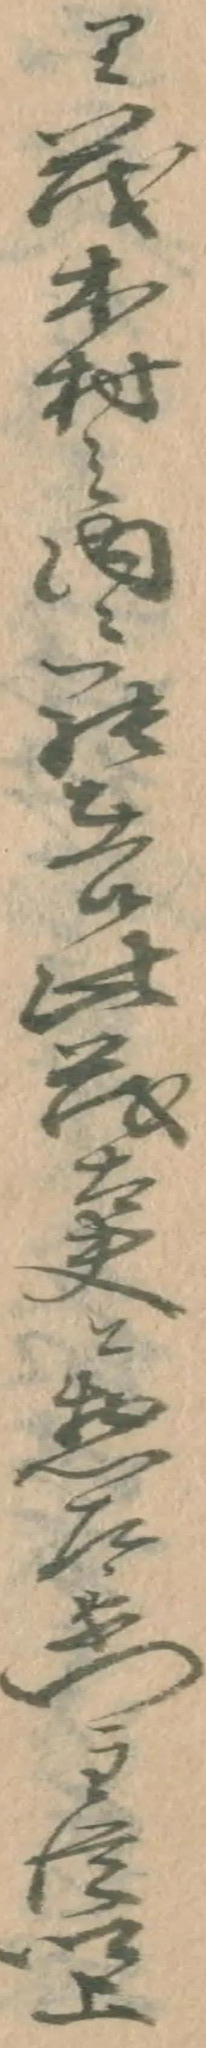り茂木村之内に罷在候此茂太夫と惣左衛門主従以上

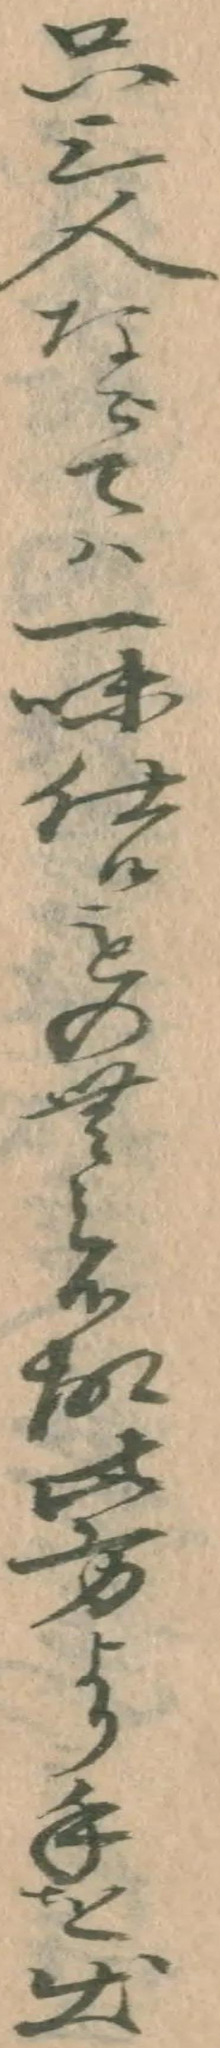只三人ならては一味仕候もの無之候故此方より手を出
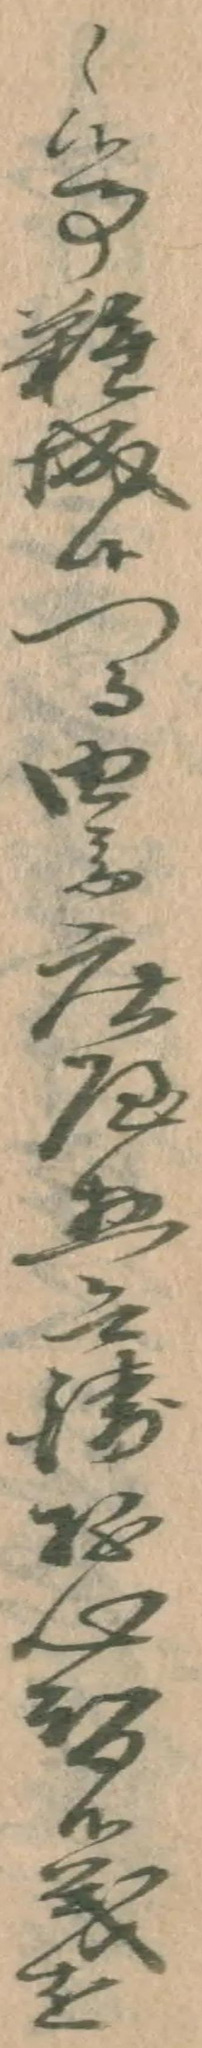し候事難成候つる由に而庄屋惣兵衛抔心替候義を
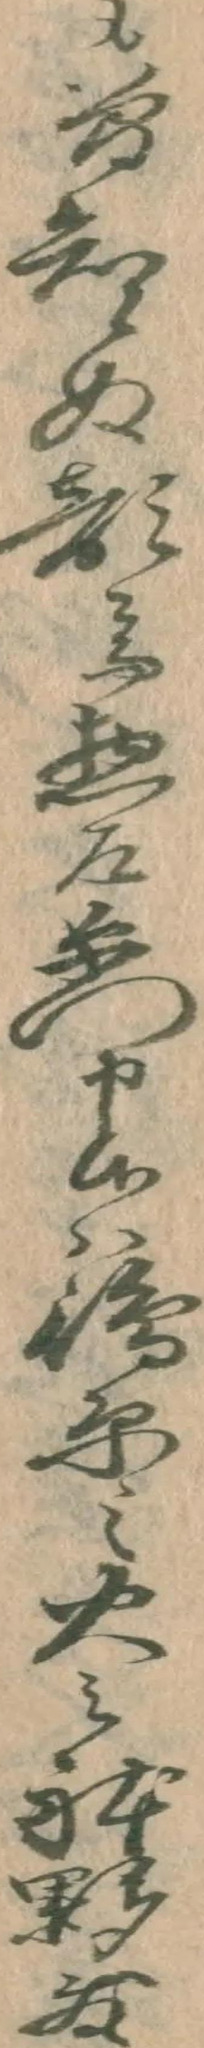も曽知らぬ顔に而惣左衛門申候は島原之火之体夥敷
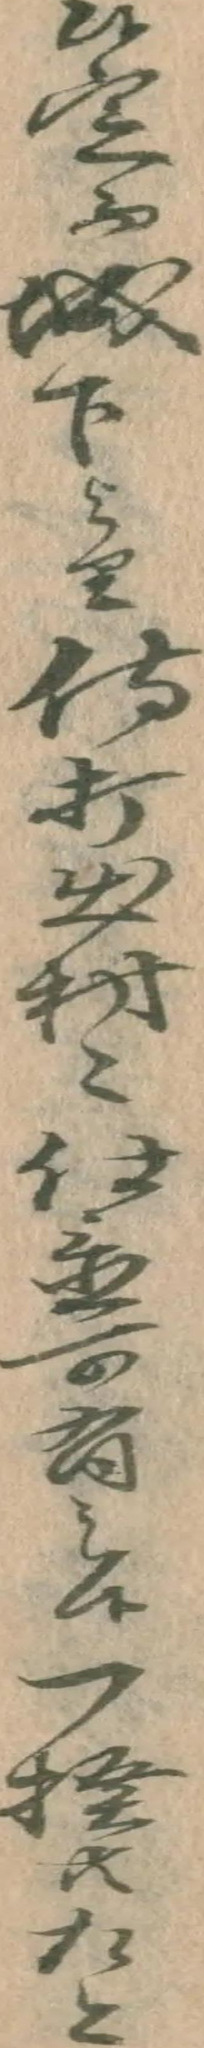候定而城下より侍打出村々仕置可有之候一揆共たと
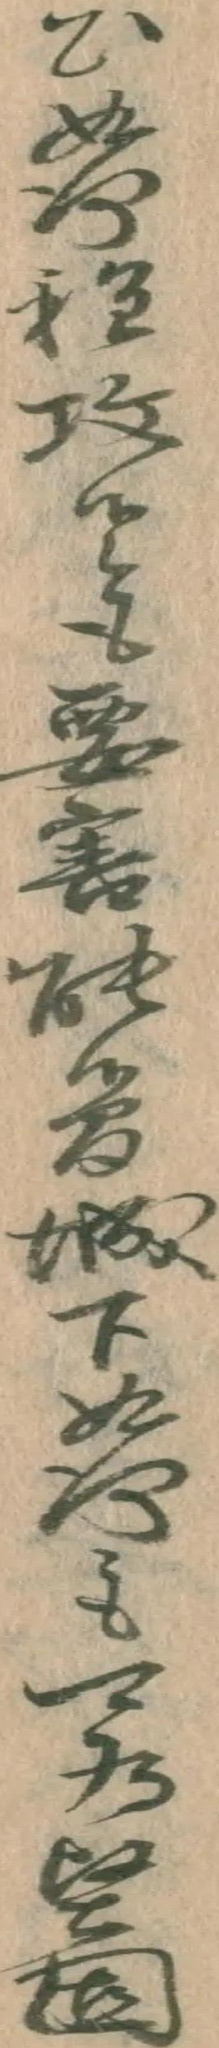ひ如何程攻候とも要害能候間城下如何にも可為堅固
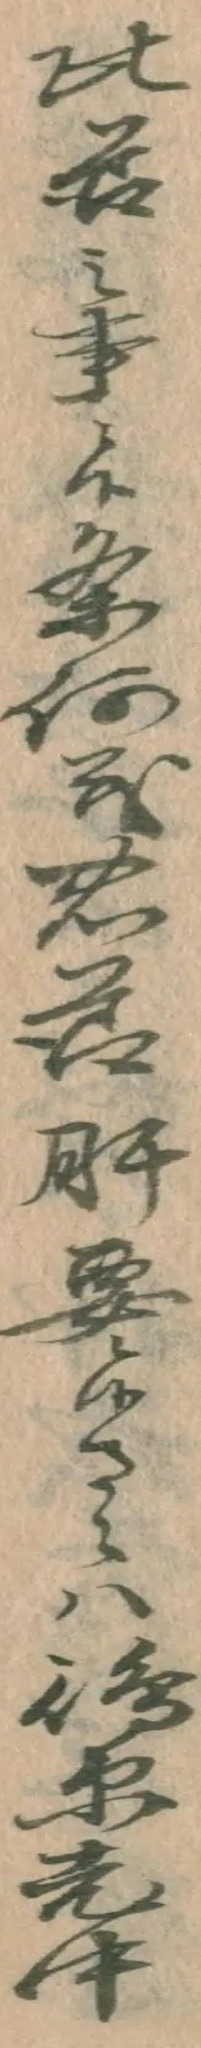此節之事に候条何も忠節肝要に候さらは島原老中
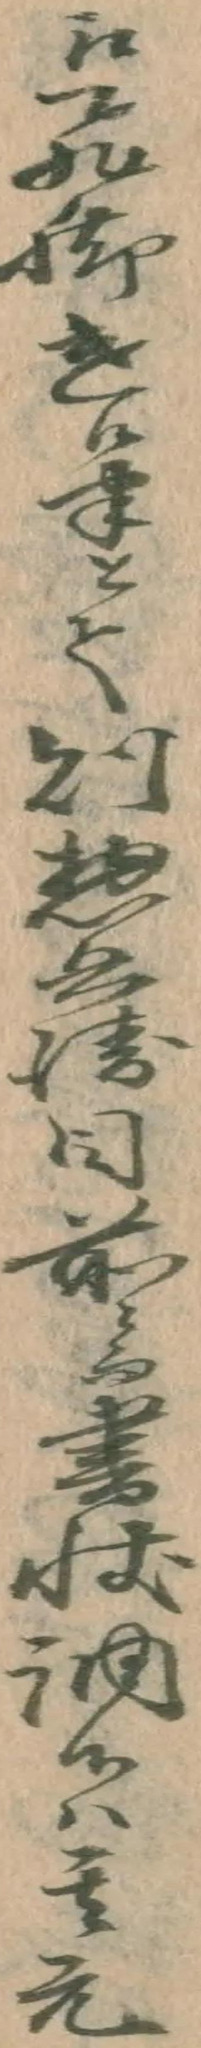え飛脚遣候半とて則惣兵衛目前に而書状調候は其元
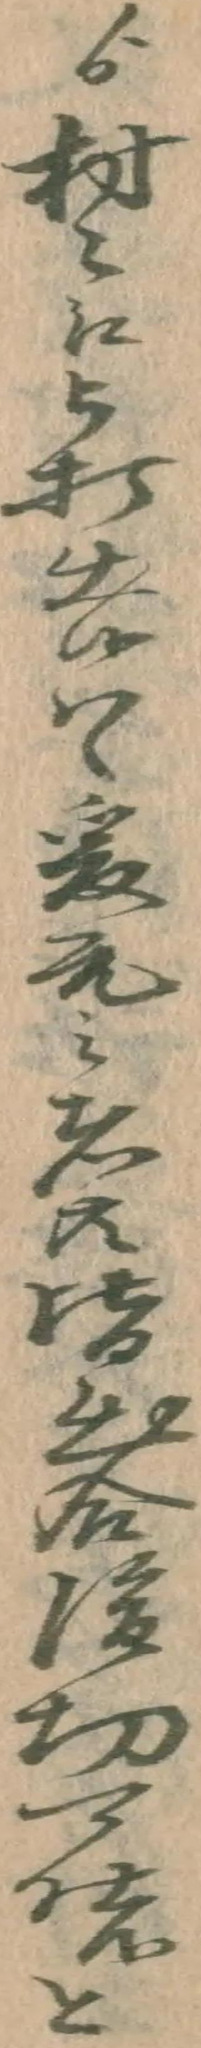ゟ村々え被打出候はゝ爰元之者共皆出合後切可仕候と
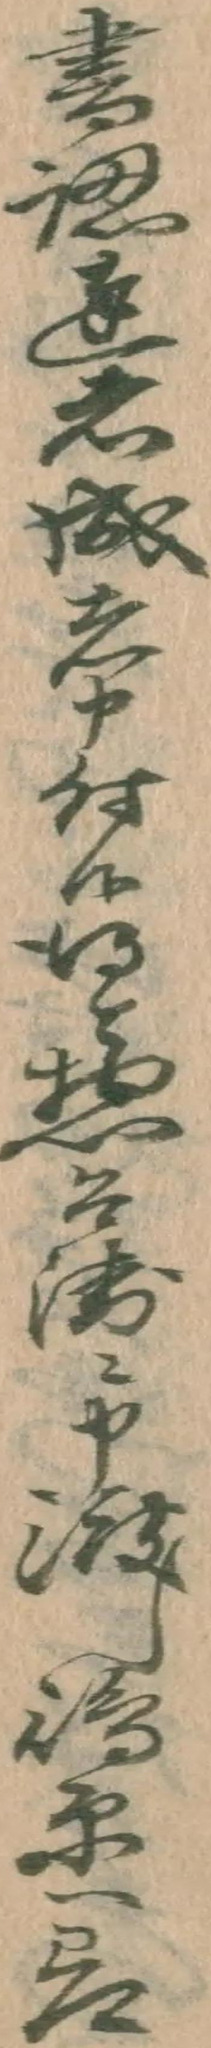書認達者成者申付候得と惣兵衛に申渡し島原へ差
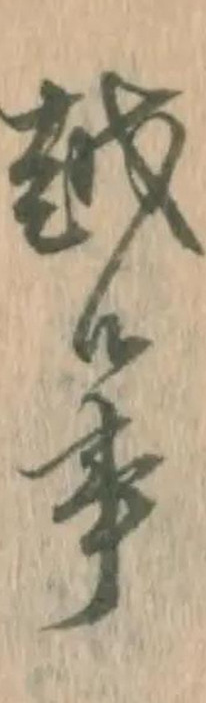越候事
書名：切支丹御退治記 49巻. [1]
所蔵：国立国会図書館 National Diet Library, JAPAN
